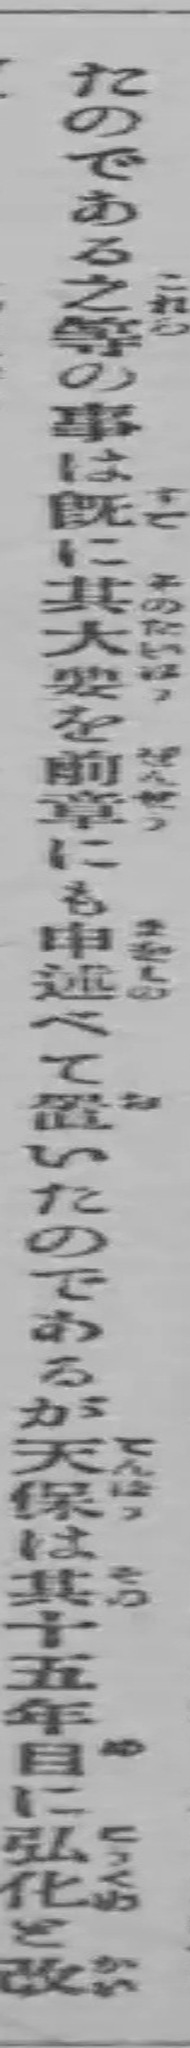たのである之等の事は既に其大要を前章にも申述べて置いたのであるが天保は其十五年目に弘化と改
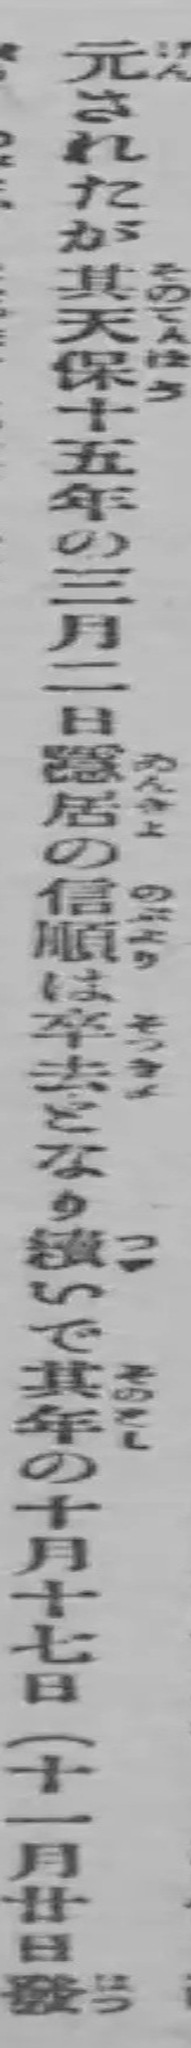信寶卒去元されたが其天保十五年の三月二日隠居の信順は卒去となり続いで其年の十月十七日(十一月廿日発
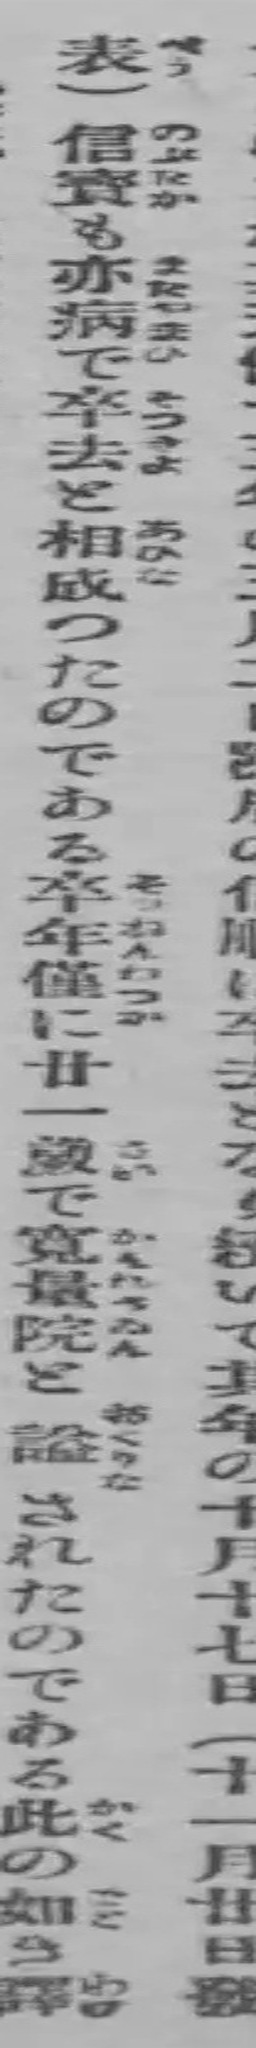表)信寶も亦病で卒去と相成つたのである卒年僅かに廿一歳で寛量院と諡されたのである此の如き訳
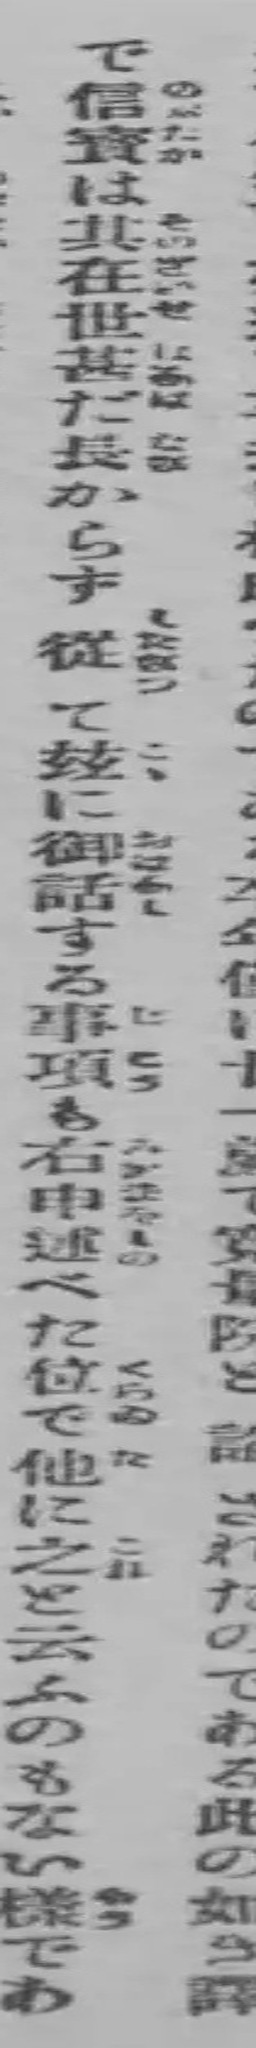で信寶は其在世甚だ長からず従て茲に御話する事項も右申述べた位で他に之と云ふのもない様であ
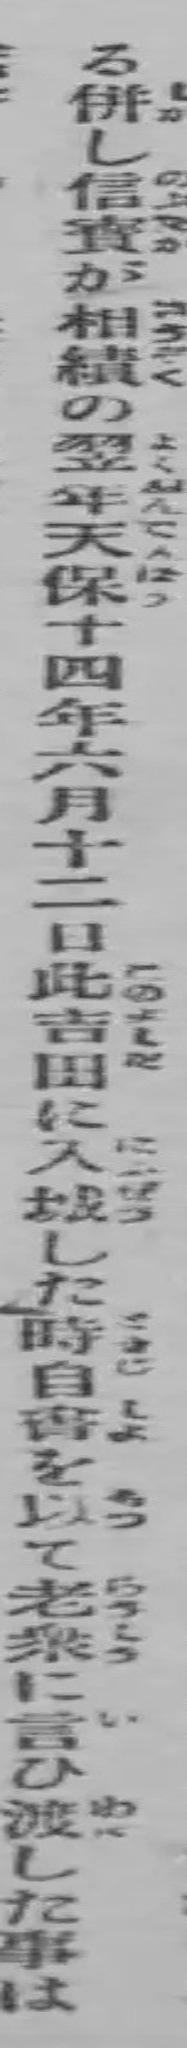る併し信寶が相続の翌年天保十四年六月十二日此吉田に入城した時自書を以て老衆に言ひ渡した事は
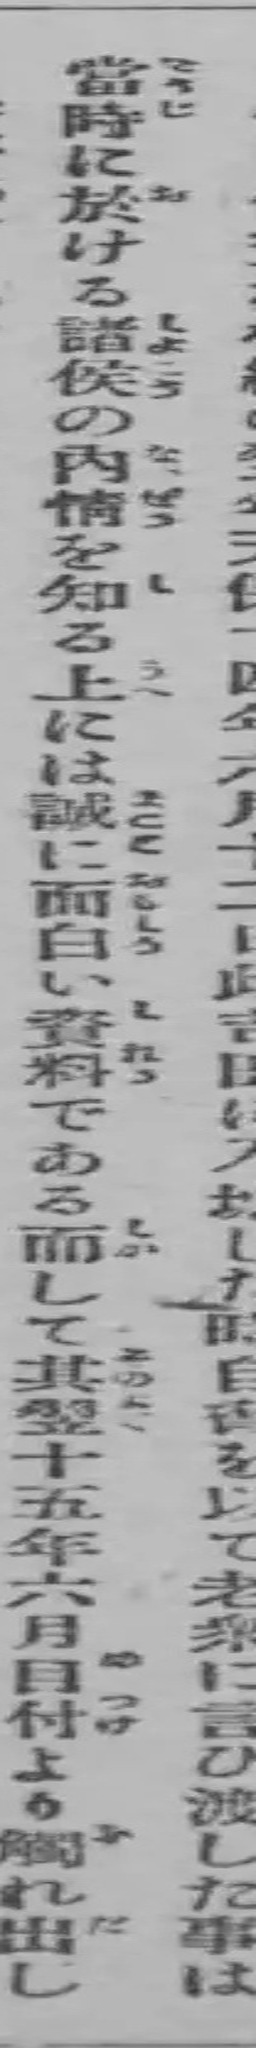当時に於ける諸侯の内情を知る上には誠に面白い資料である而して其翌十五年六月目付より觸れ出し
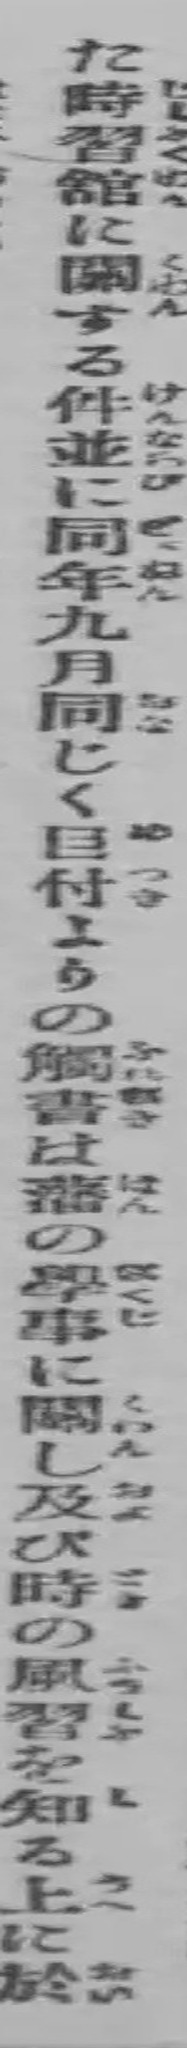た時習館に関する件並に同年九月同じく目付よりの觸書は藩の学事に関し及び時の風習を知る上に於
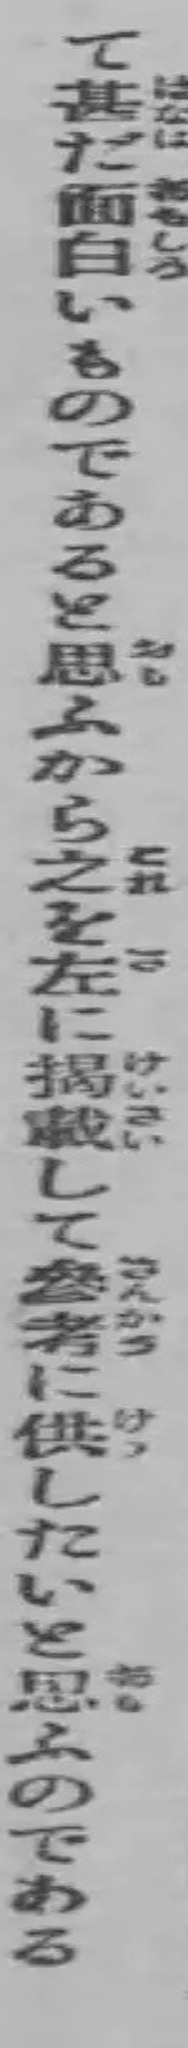て甚だ面白いものであると思ふから之を左に掲載して参考に供したいと思ふのである
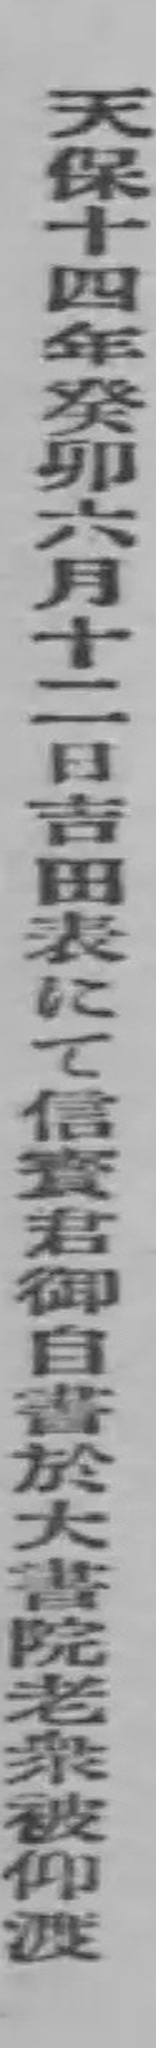天保十四年癸卯六月十二日吉田表にて信寶君御自書於大書院老衆被仰渡
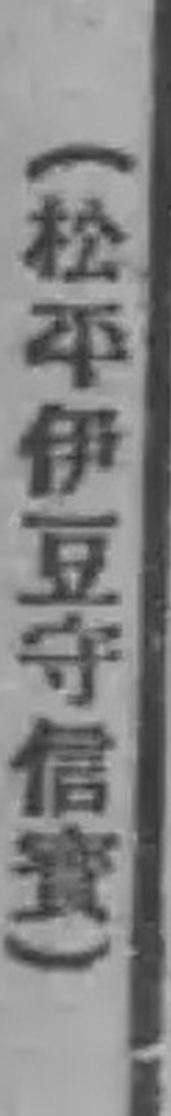⦿松平伊豆守信寶

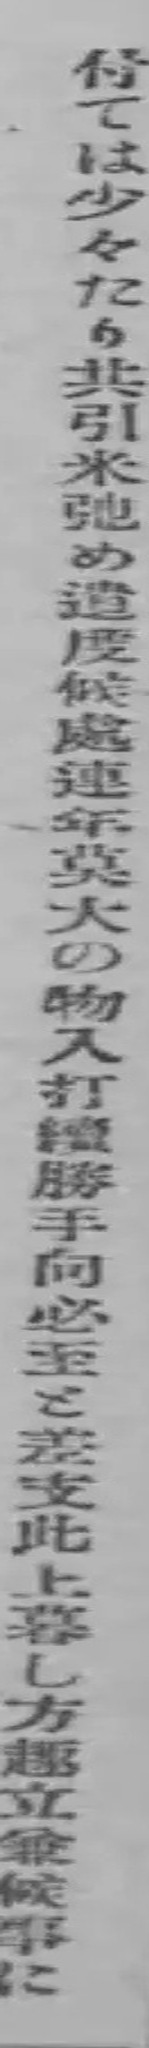付ては少々たり共引米弛め遣度候処連年莫大の物入打続勝手向必至と差支此上暮し方趣立兼候事に
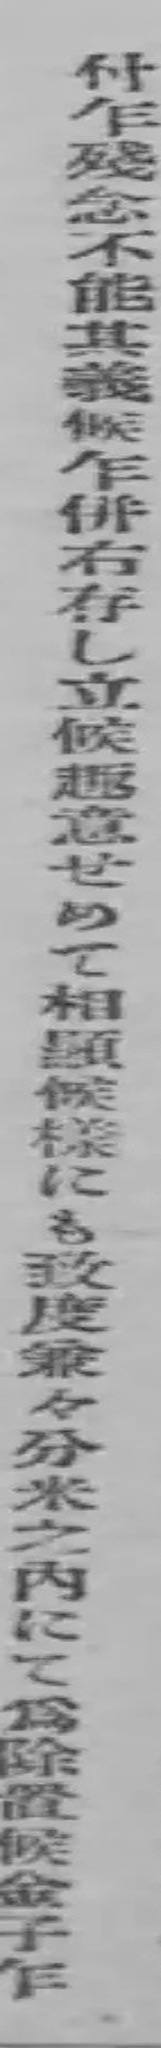付乍残念不能其義候乍併右存し立候趣意せめて相顕候様にも致度兼々分米之内にて為除置候金子乍
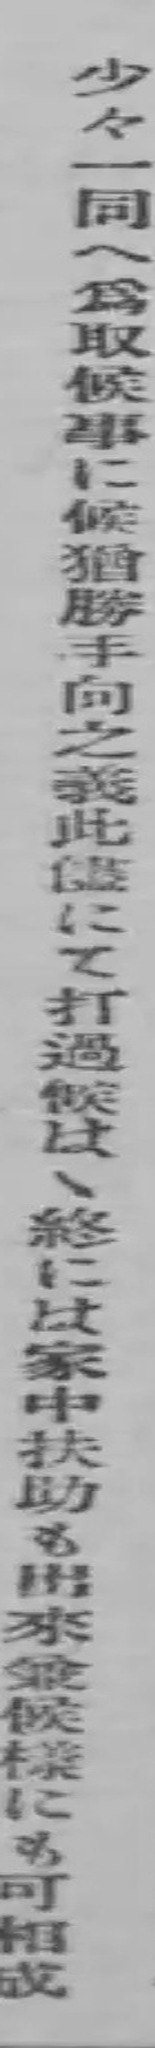少々一同へ為取候事に候猶勝手向之義此侭にて打過候はゝ終には家中扶助も出来兼候様にも可相成
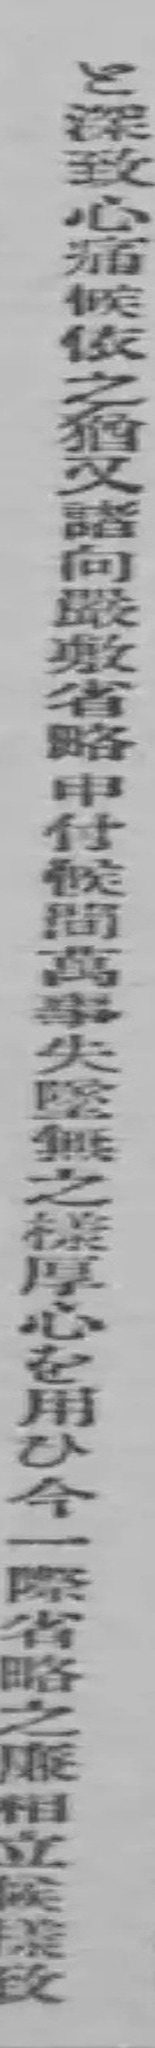と深致心痛候依之猶又諸向厳敷省略申付候間万事失墜無之様厚心を用ひ今一際省略之廉相立候様致
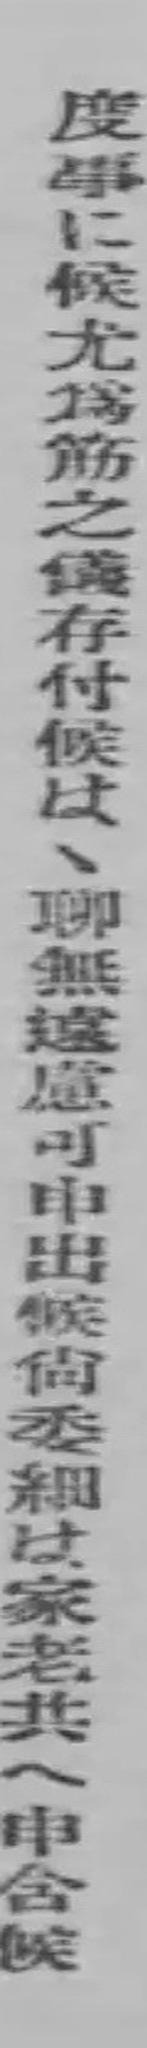度事に候尤為筋之儀二年存付候はゝ聊無遠慮可申出候尚委細は家老共へ申含候
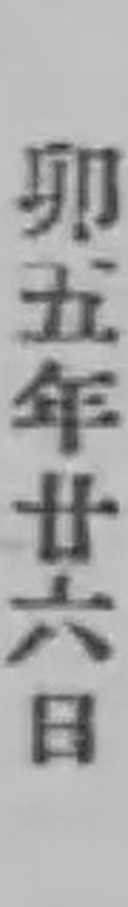卯五年廿六日
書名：豊橋市史談
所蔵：国立国会図書館 National Diet Library, JAPAN
